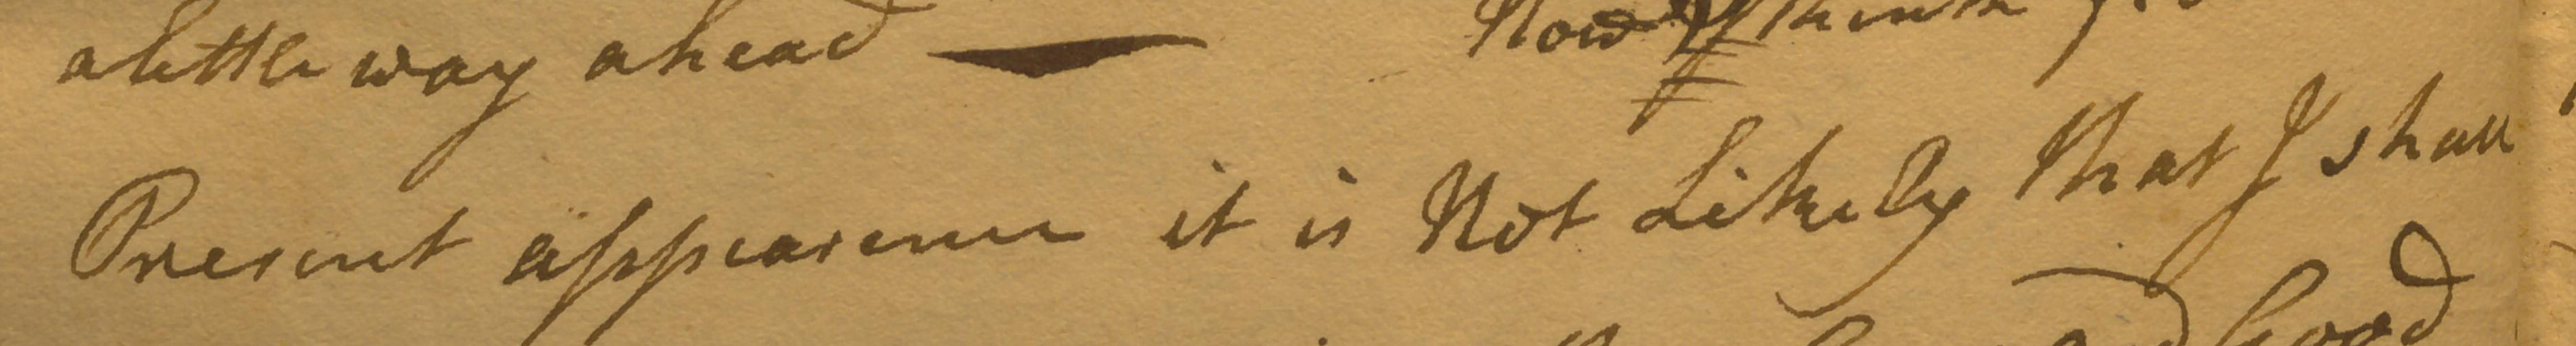Present appearence it is Not Likely that I shall
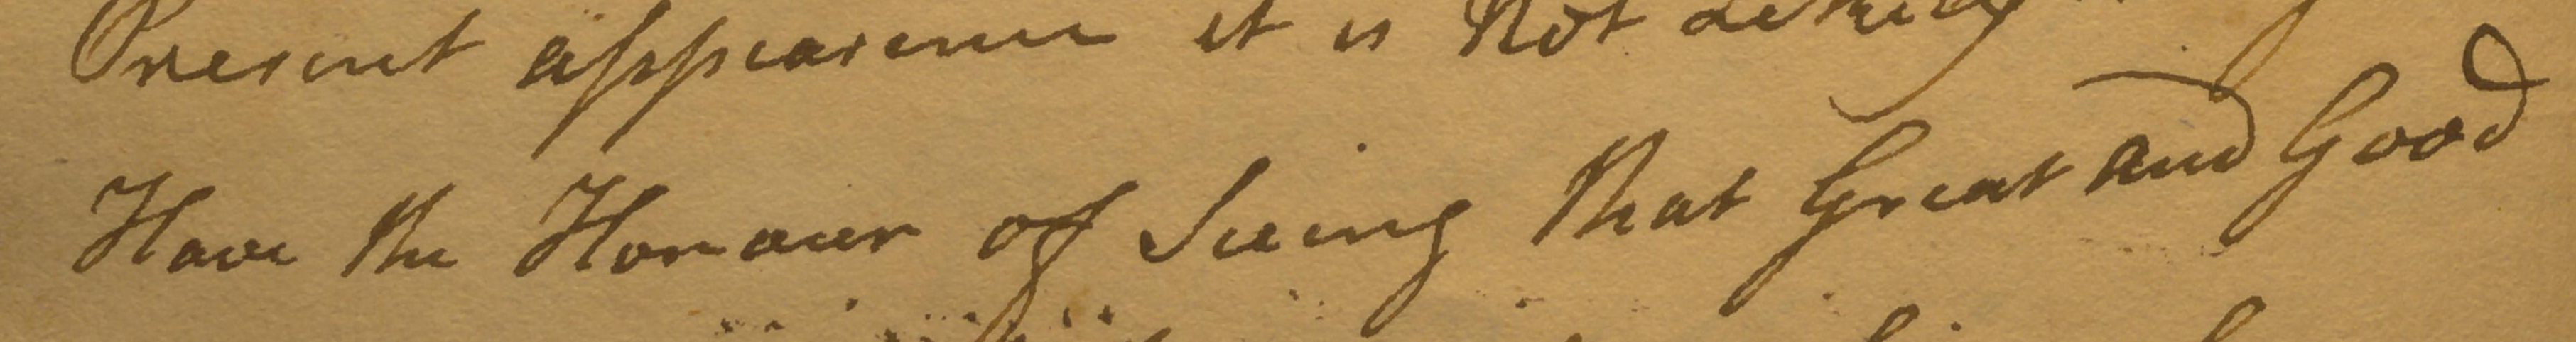Have the Honour of seeing that Great and Good
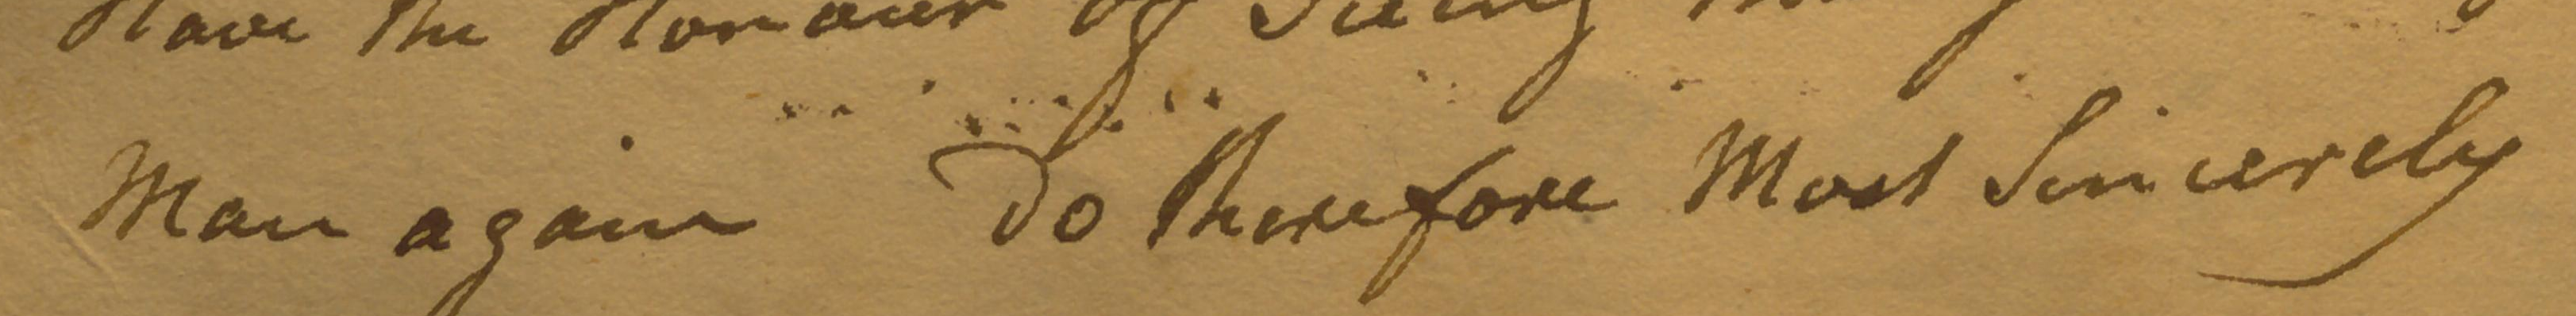Man again, do therefore Most sincerely
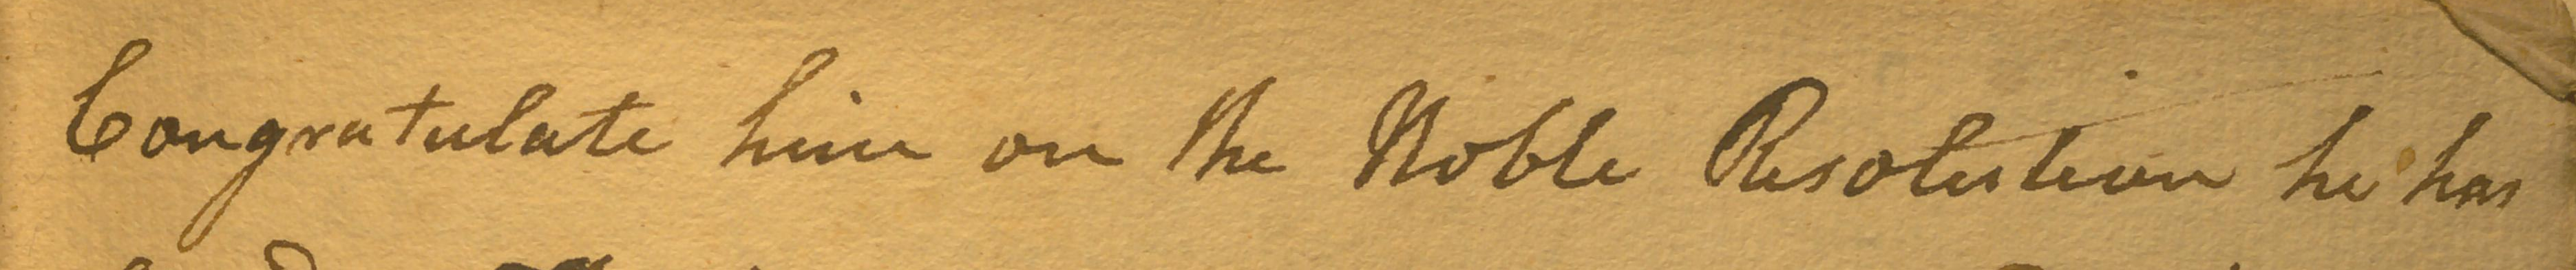Congratulate him on the Roble Resolution he has
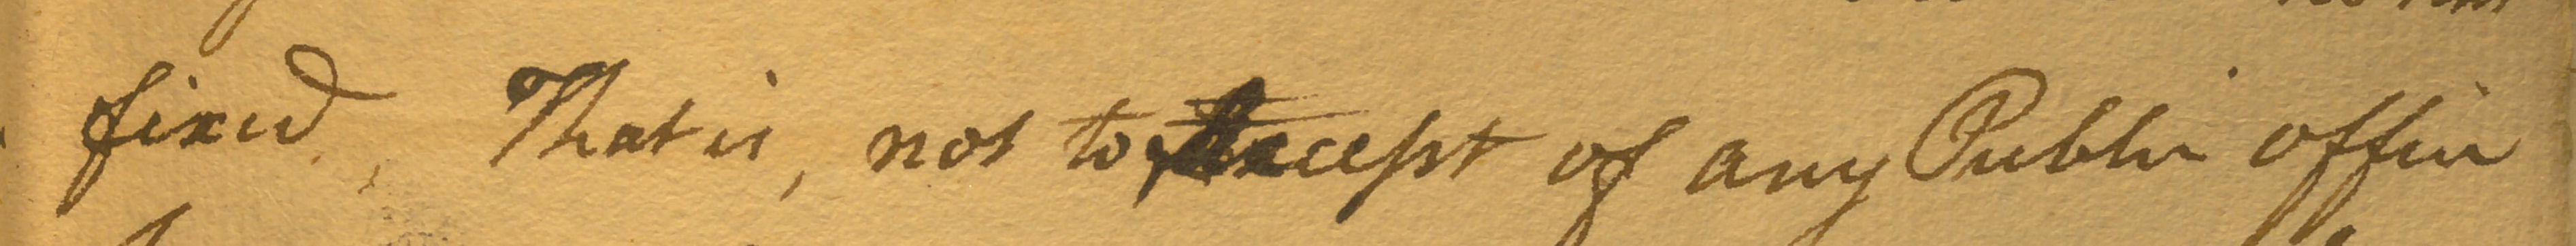fixed That is not to Accept of any Public officer
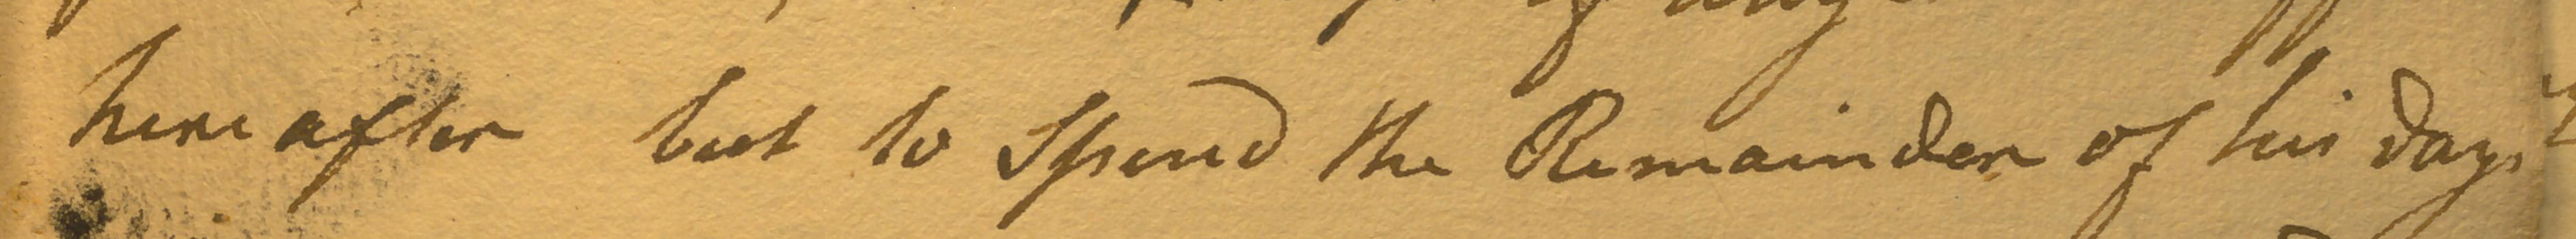here after but to spend the Remainder of his days
